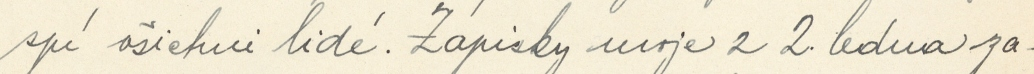spí všichni lidé. Zápisky moje z 2. ledna za-
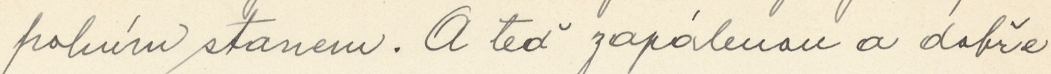polním stanem. A teď zapálenou a dobře
